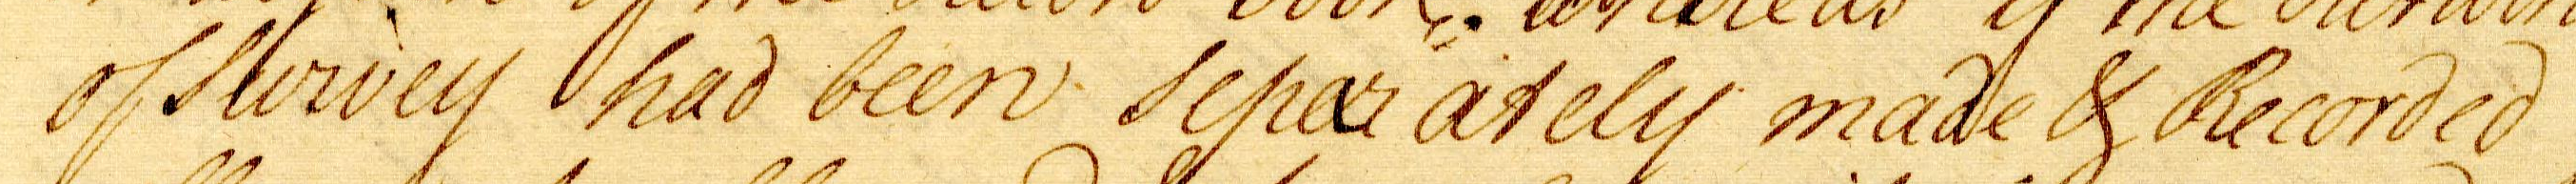of Survey had been separately made & Recorded
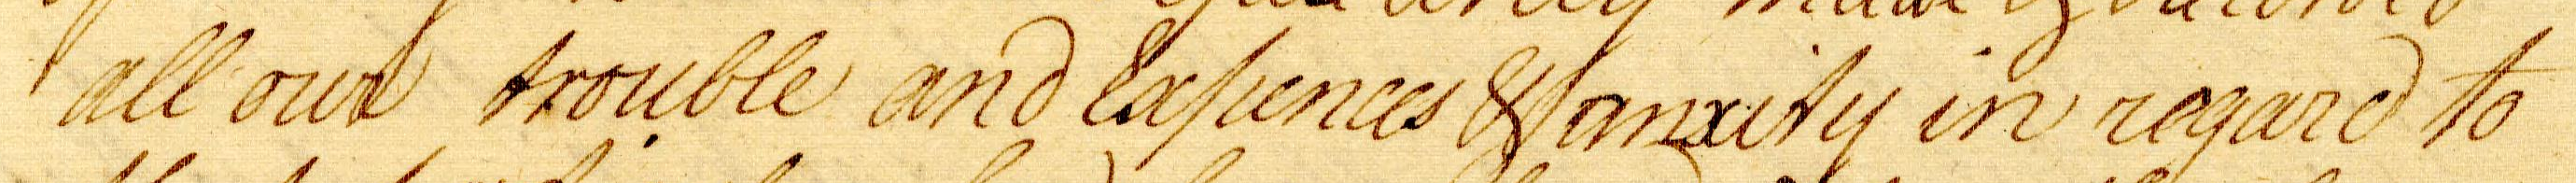all our trouble and Expenses & anxity in regard to
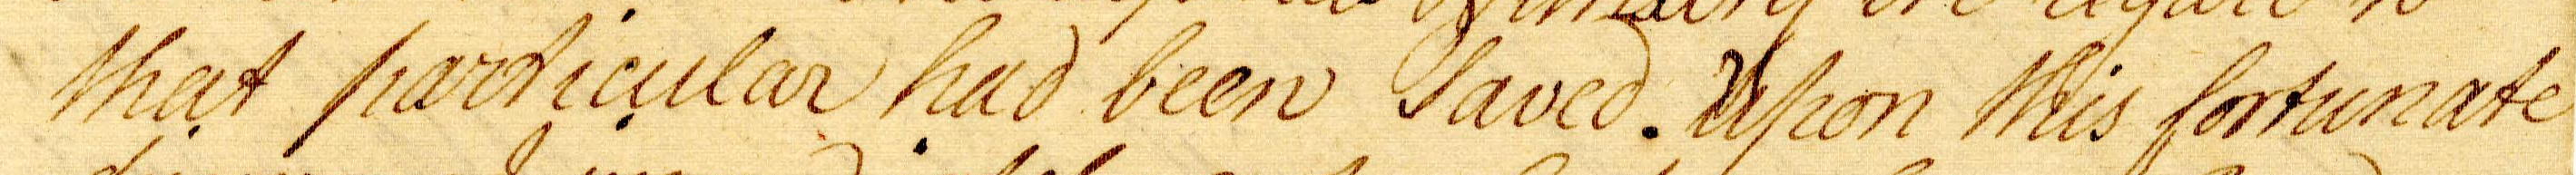that particular had been Saved. Upon this fortunate
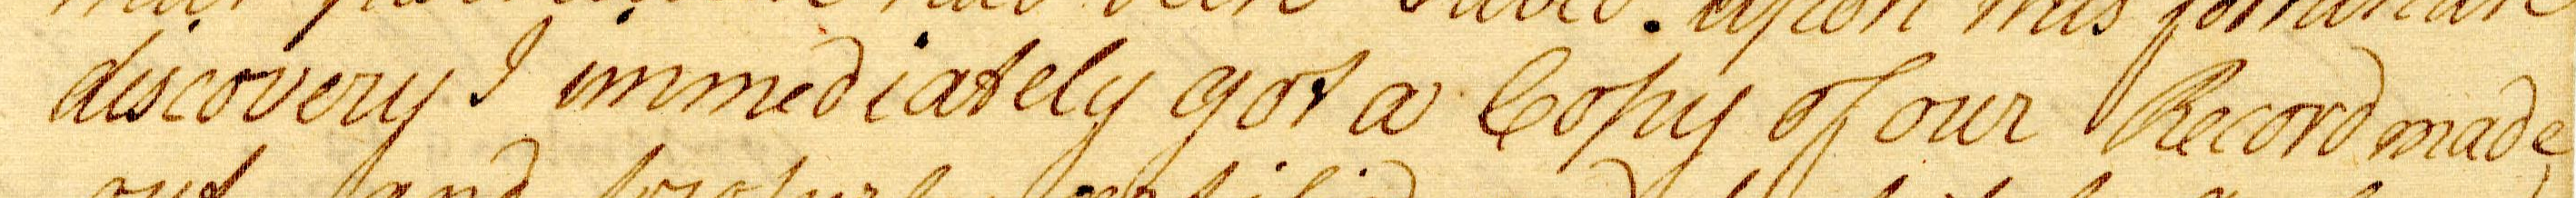discovery I immediately got a Copy of our Record made
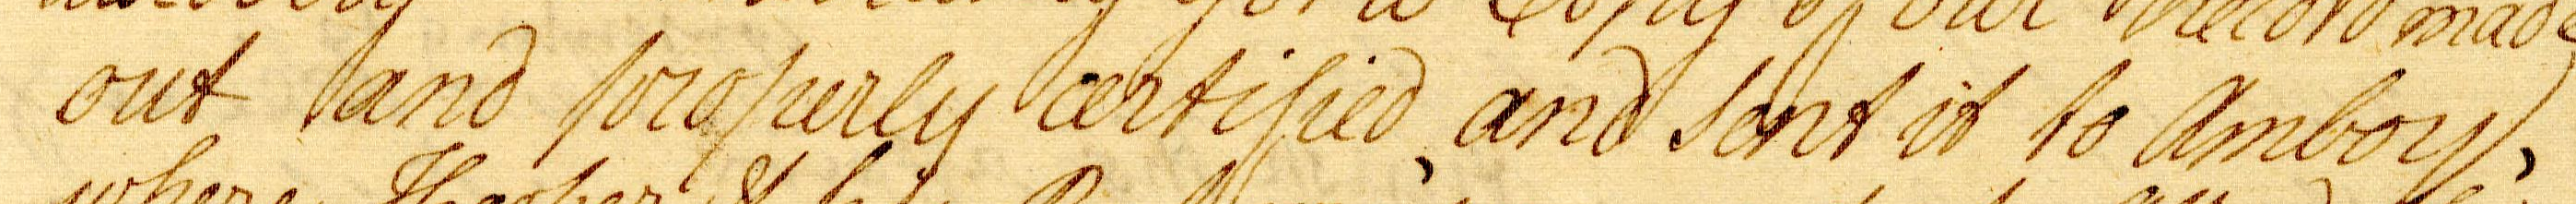out and properly certified, and Sent it to Amboy,
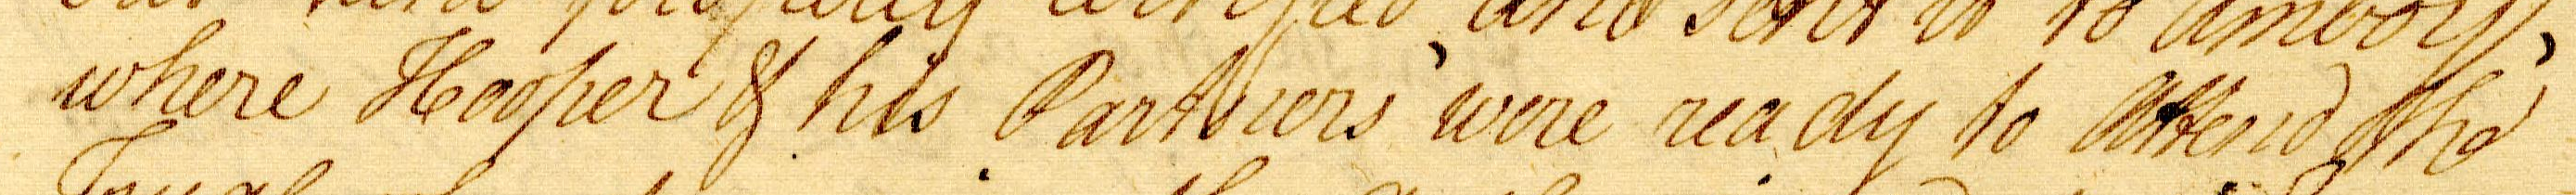where Hooper & his Partners were ready to Attend the
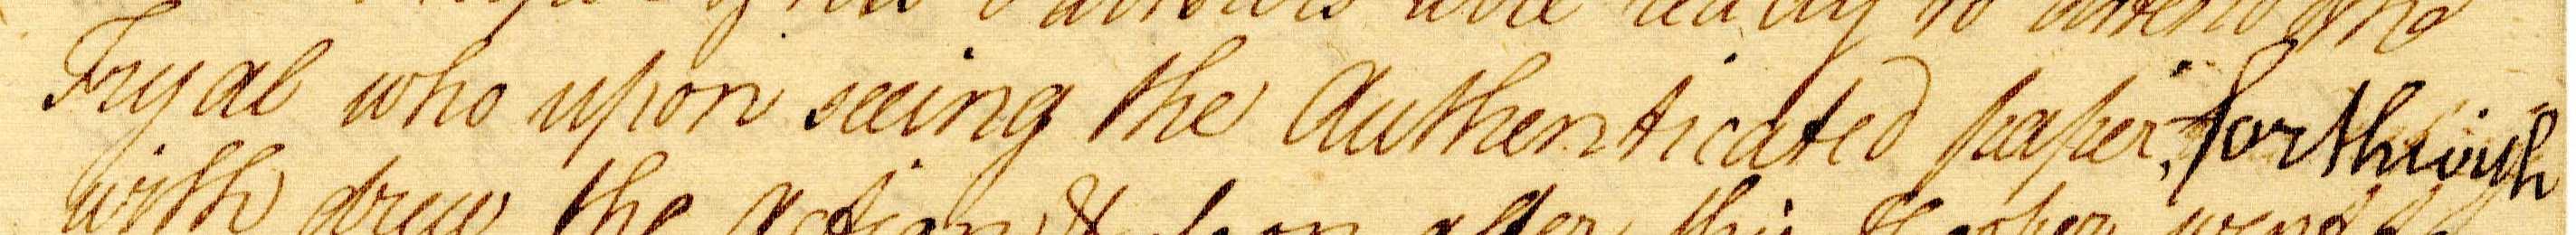Tryal who upon seeing the Authenticated paper, forthwith
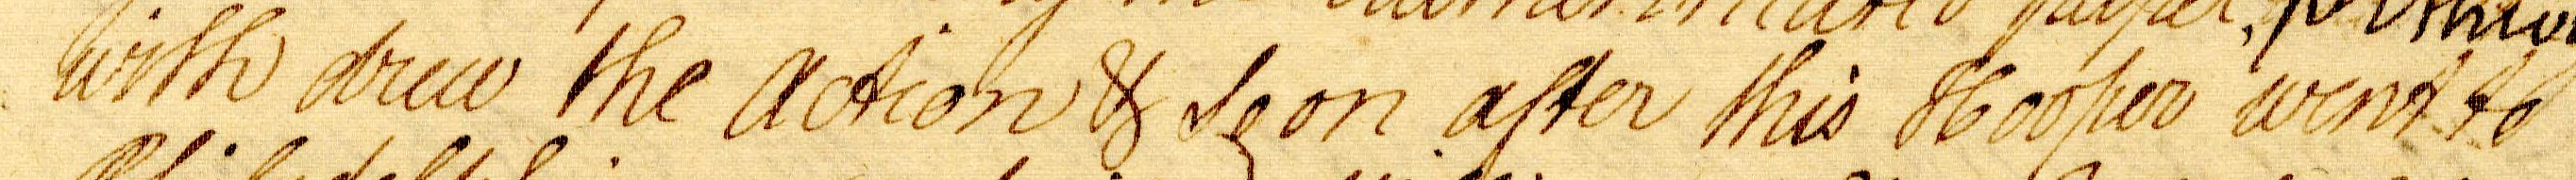with drew the Action & Soon after this Hooper went to
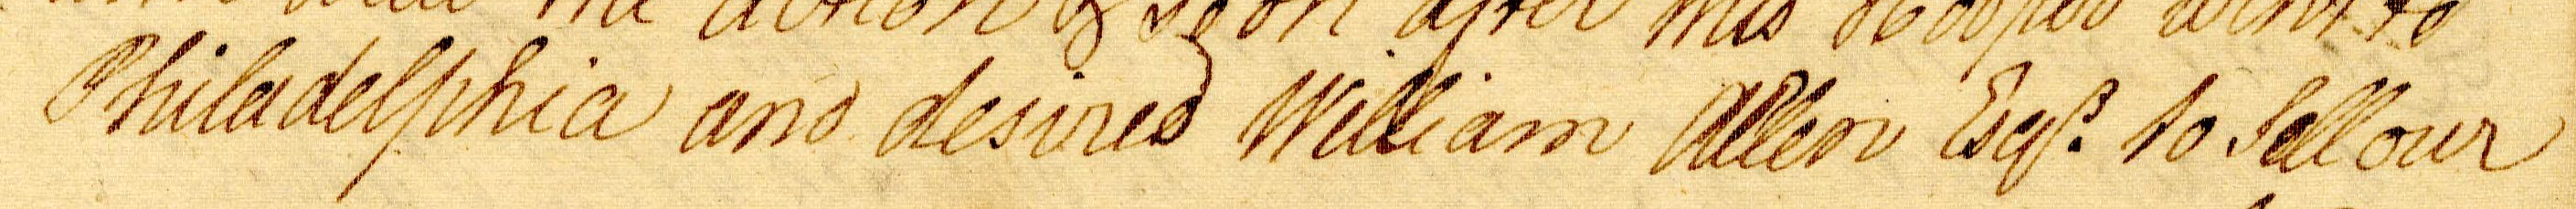Philadelphia and desired William Allen Eq^r. to Sell our
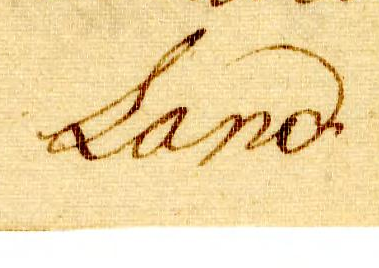Land
